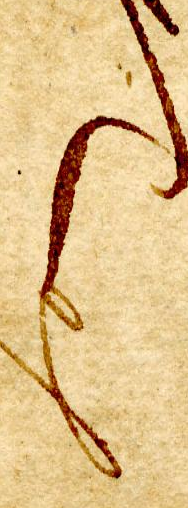To
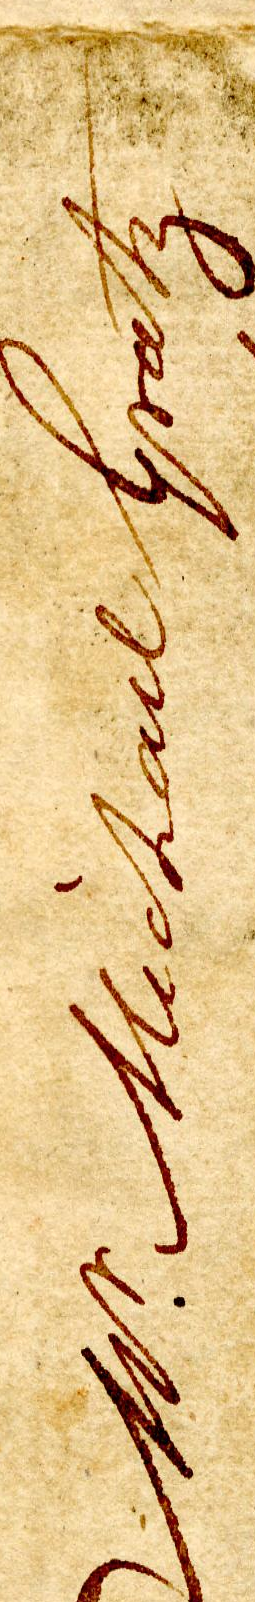M^r Michael Gratz
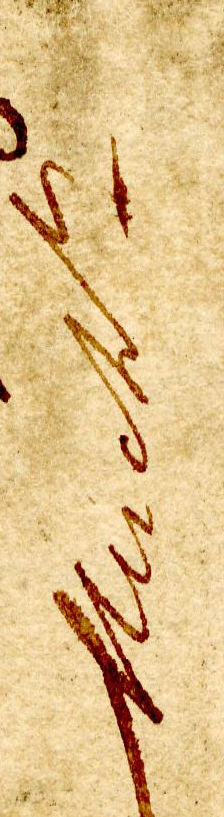Merch^t
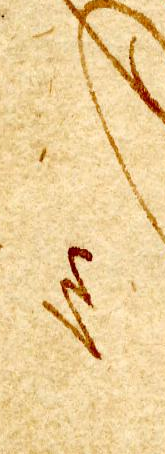in
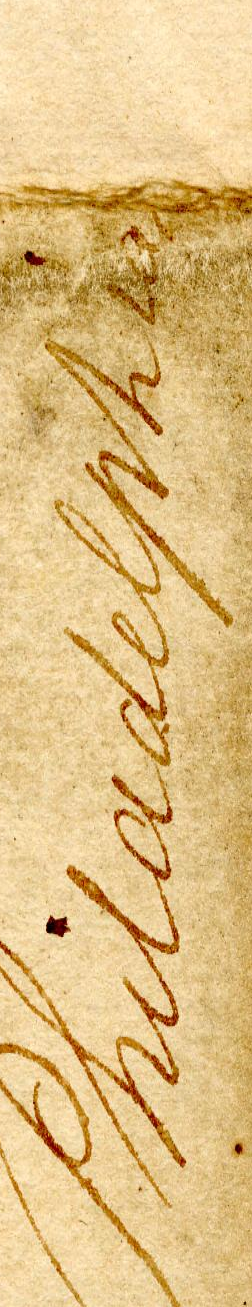Philadelphia
